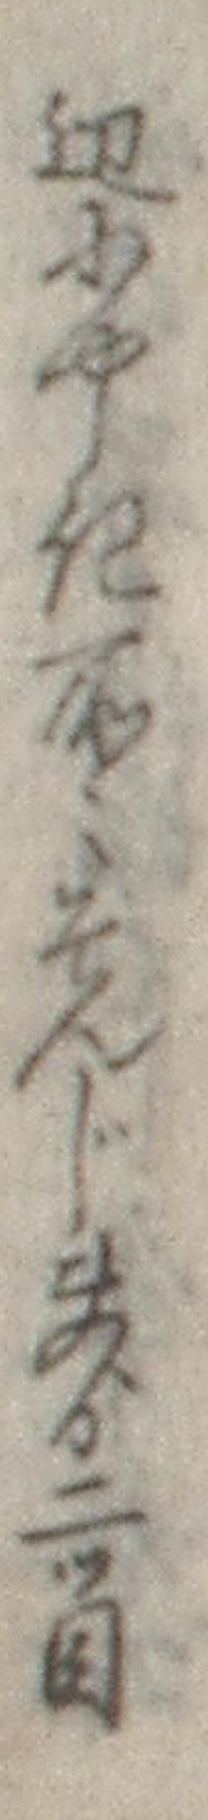辺小やしき所〻そんじ夫ゟ二ツ目
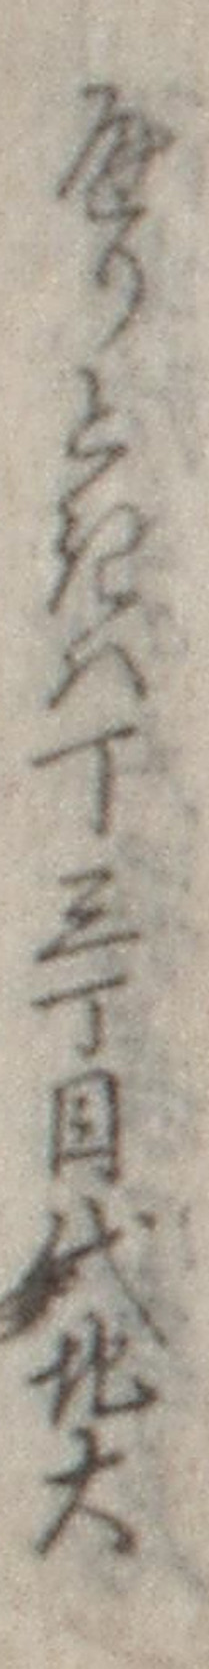通りときは丁三丁目代地大

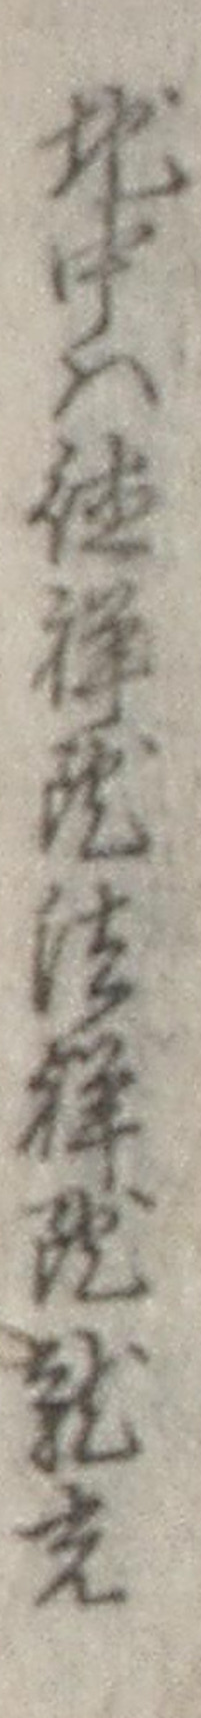地中は徳祥院法褝院龍光
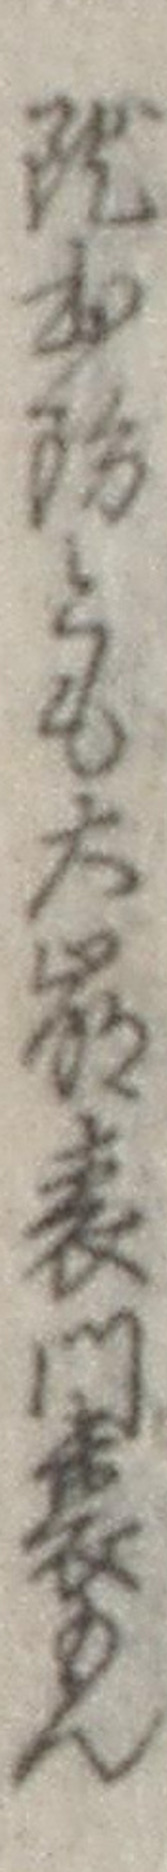院本防とも大崩表門裏もん
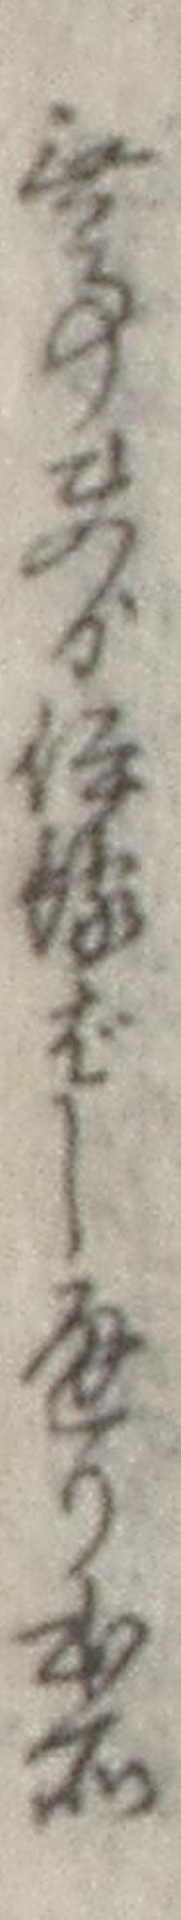無事夫ゟ伊豫ばし通り本所
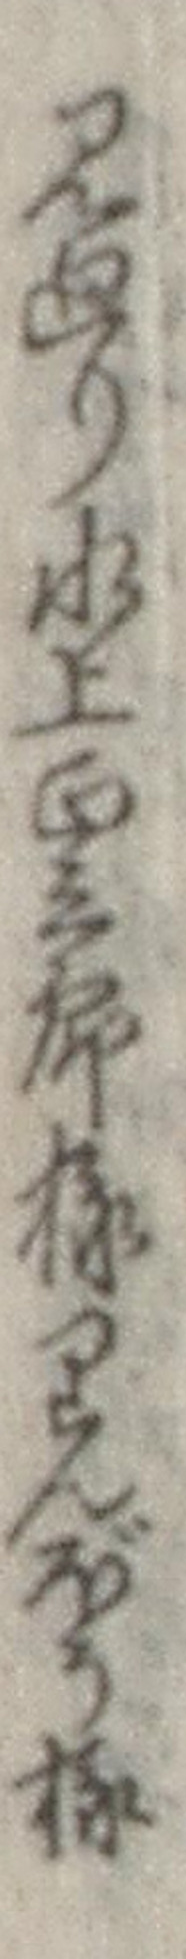見廻り水上白三郎様りんぼう様
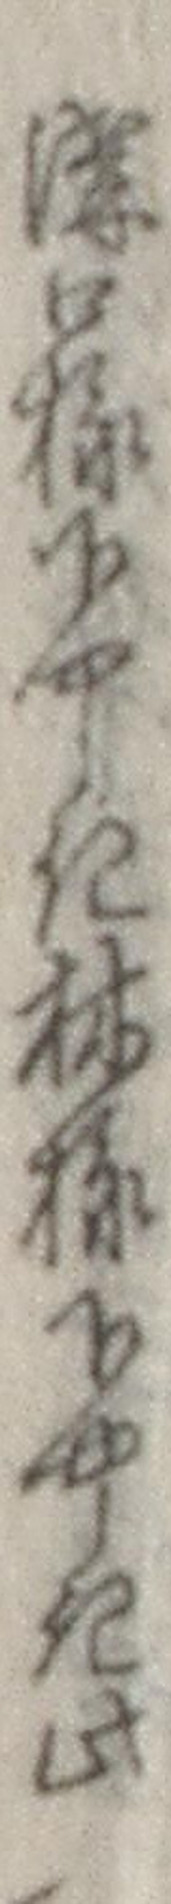濱口様下やしき林様下やしき此
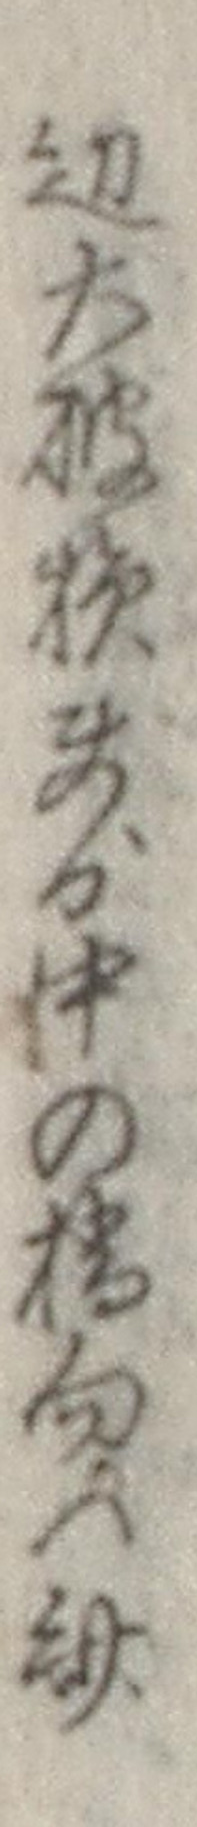辺大破損夫ゟ仲の橋向は斉
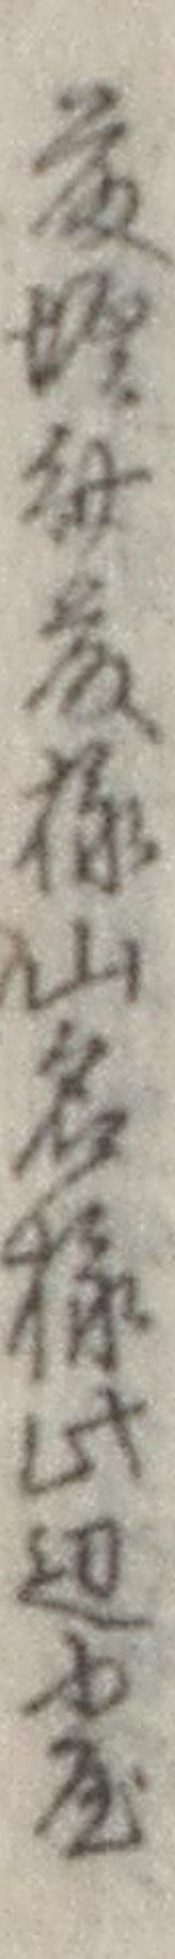藤堀斉藤様山名様此辺小屋
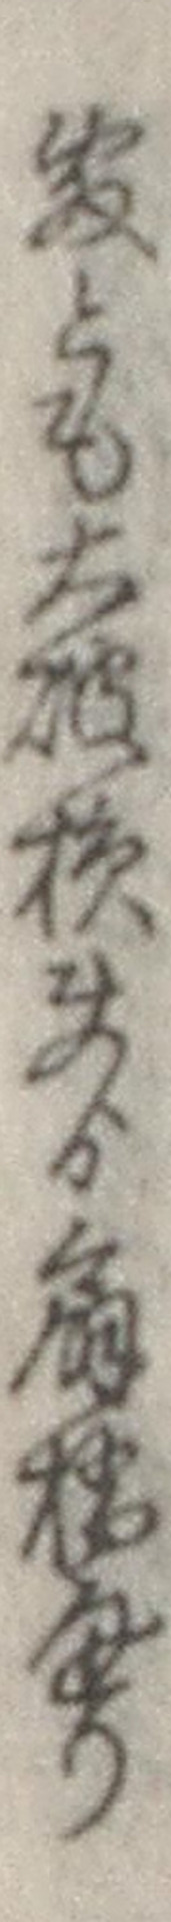敷とも大破損夫ゟ扇桜通り
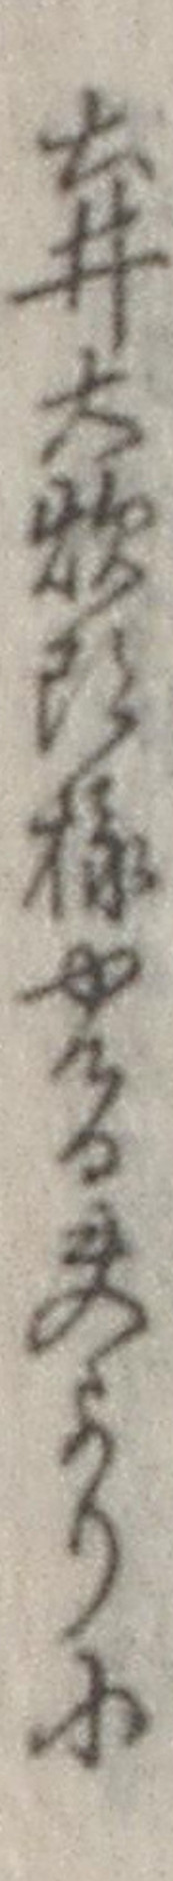土井大炊頭様やける夫より小
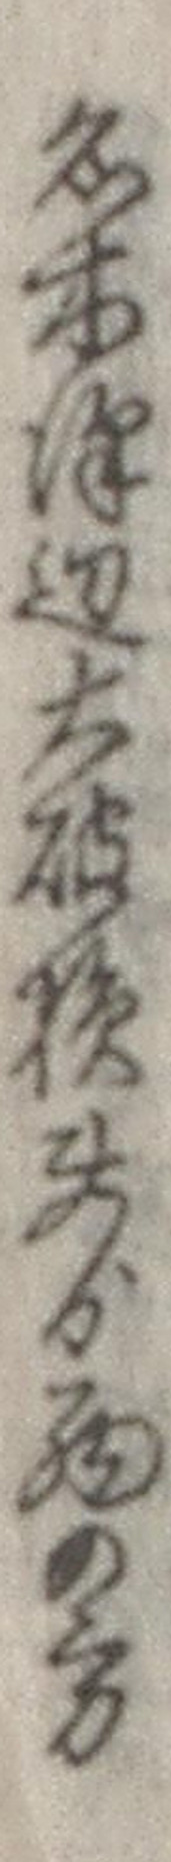名木津辺大破損夫ゟ西の方
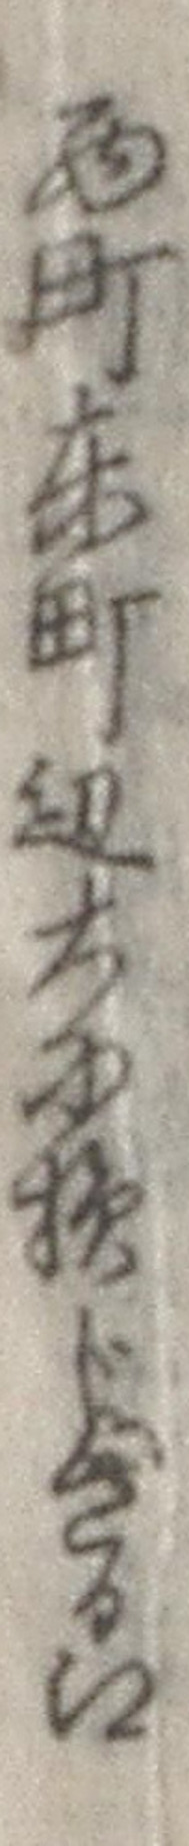西町東町辺大に損じさる江
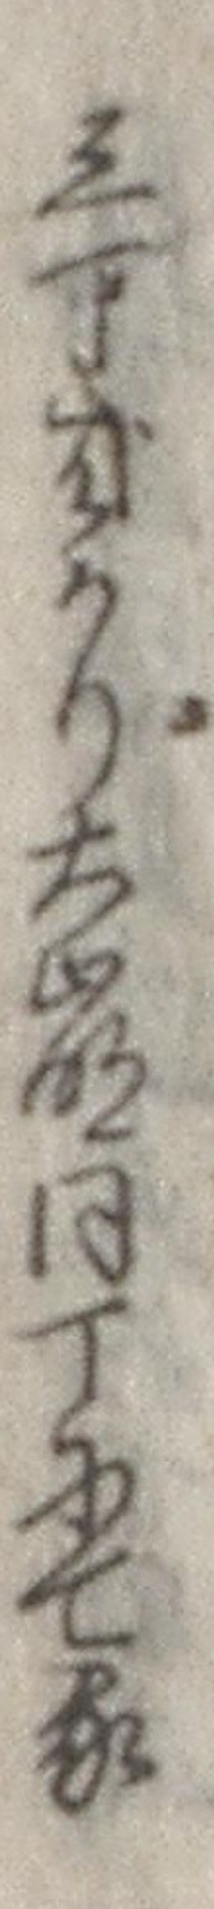三丁ばかり大崩同丁にて家
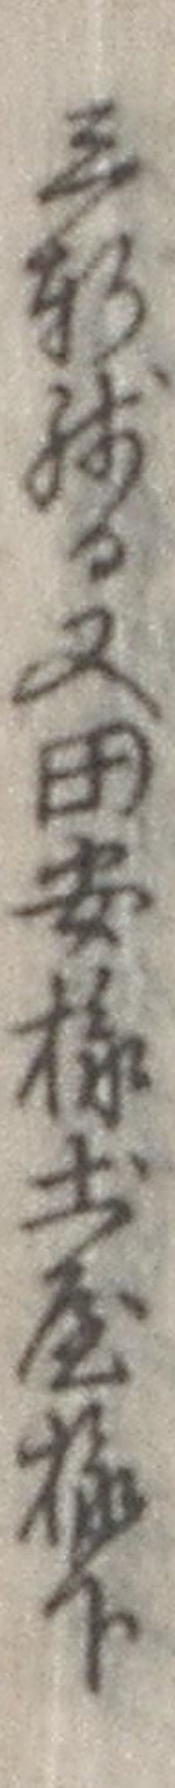三軒残る又田安様土屋様下
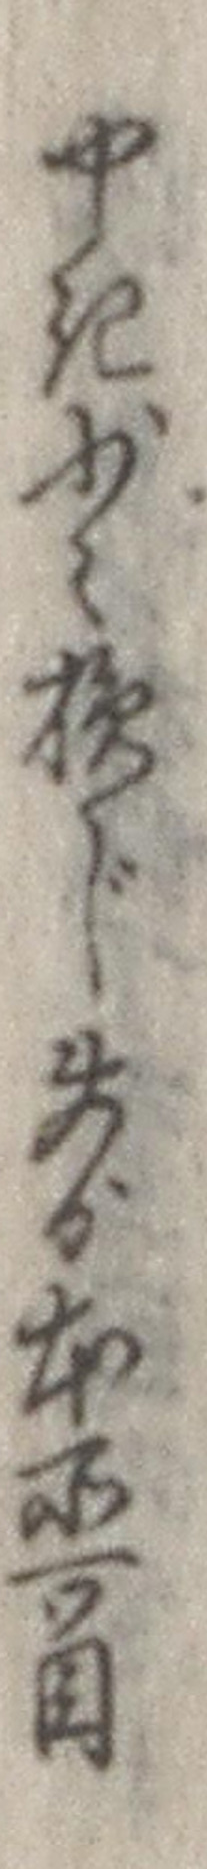やしき少〻損じ夫ゟ本所一ツ目
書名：江戸　大地震臣細録　全
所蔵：東京大学地震研究所図書室 Earthquake Research Institute Library, The University of Tokyo, JAPAN
